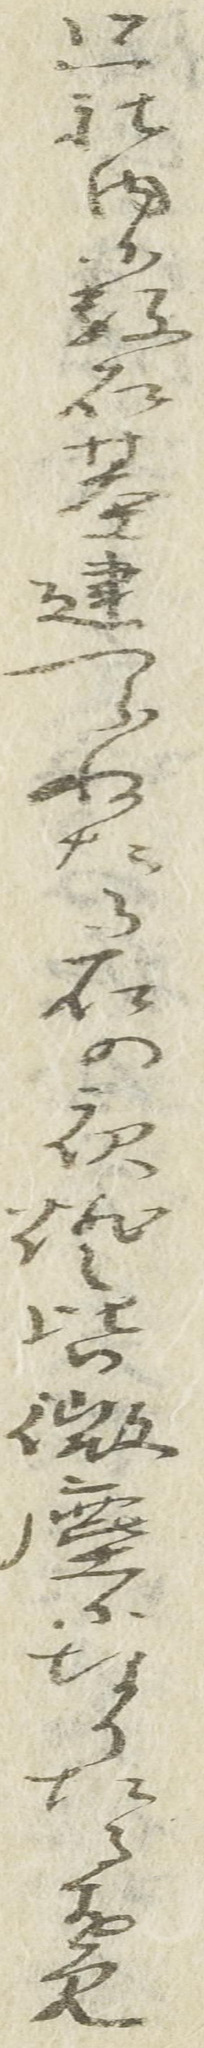只社内に数石基建つらねたる石の夜燈皆微塵になりたるを見
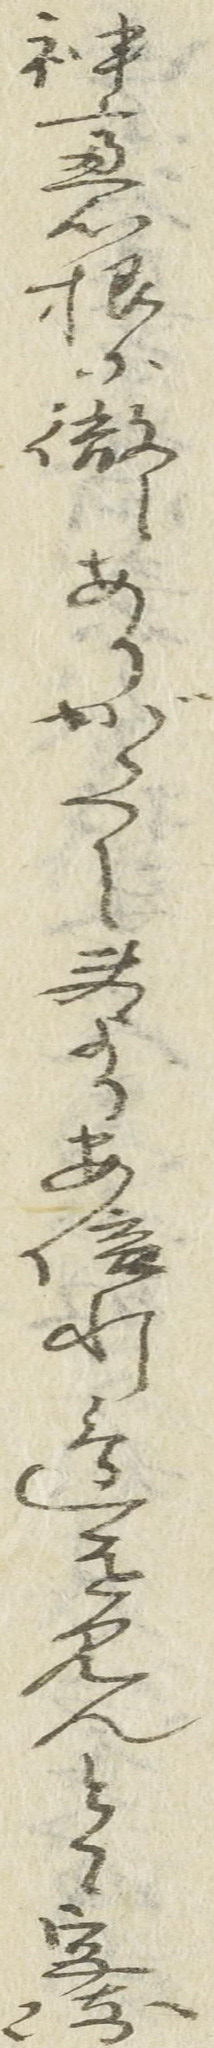神慮心根に徹しありがたし夫より安倍川辺を見んとて宮崎
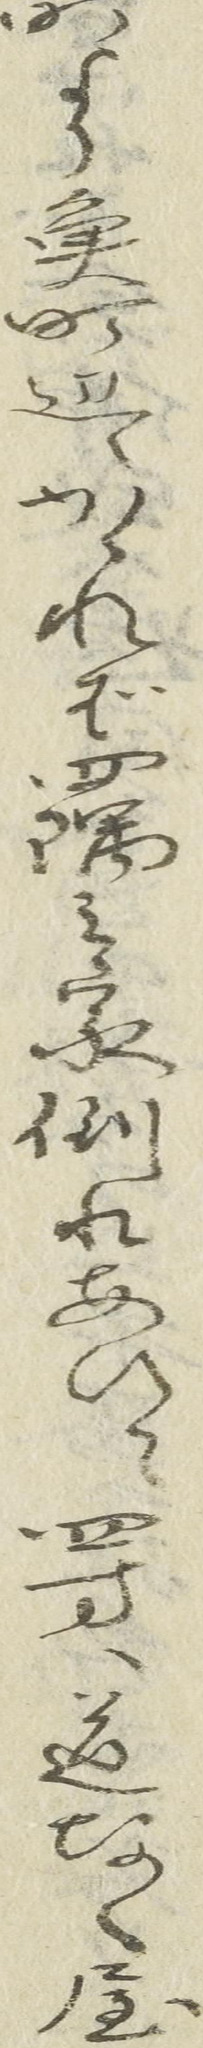町より魚町辺りへかゝれば四隅之家倒れあひて四方へ道なく屋
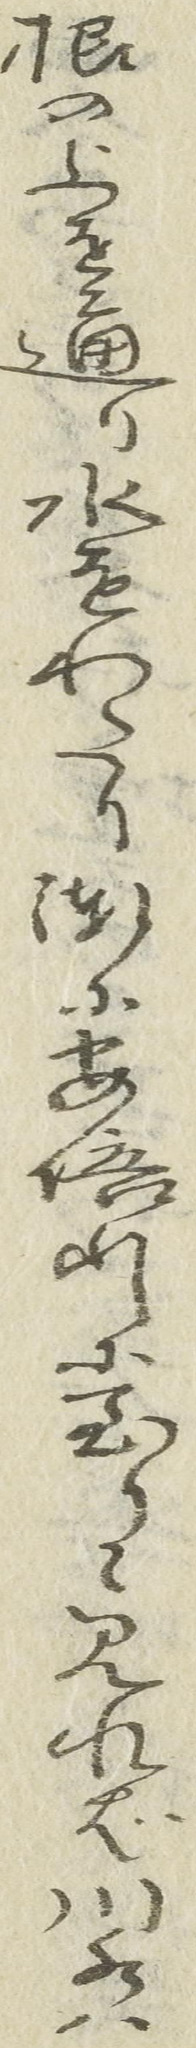根の上を通り水をわたり漸に安倍川に至りて見れば川水は
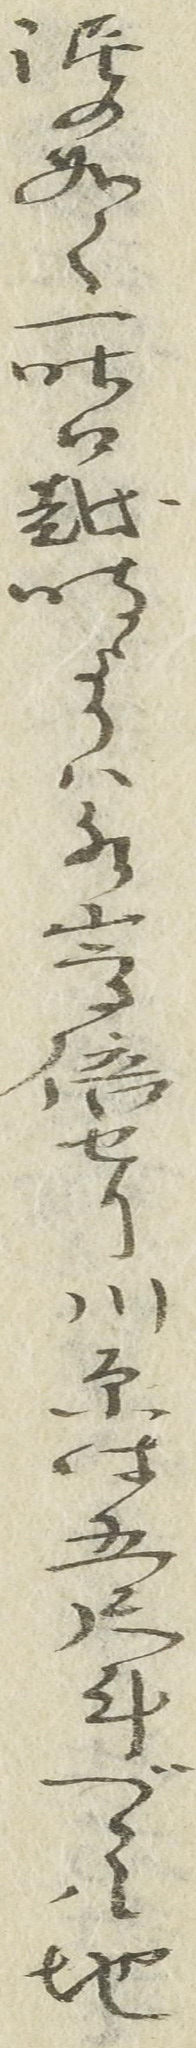泥の如く一昨日越時よりは水嵩倍せり川原は五尺斗づゝも地
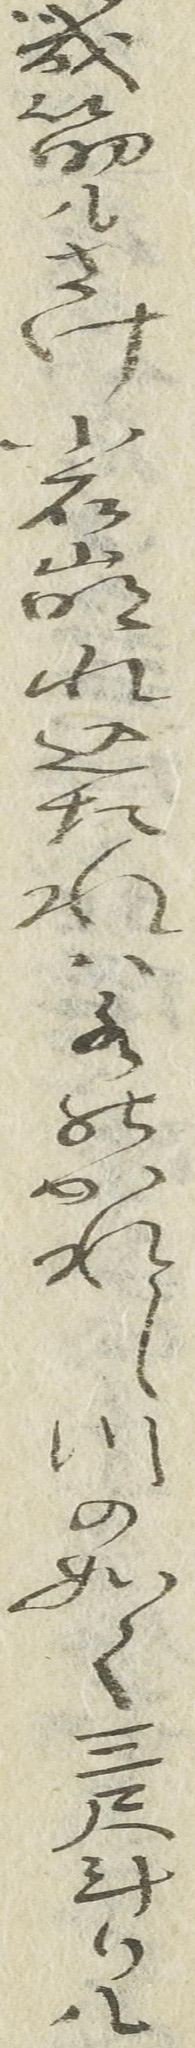幾筋もさけ小石崩れ込たれは水のかれし川の如く三尺斗りも
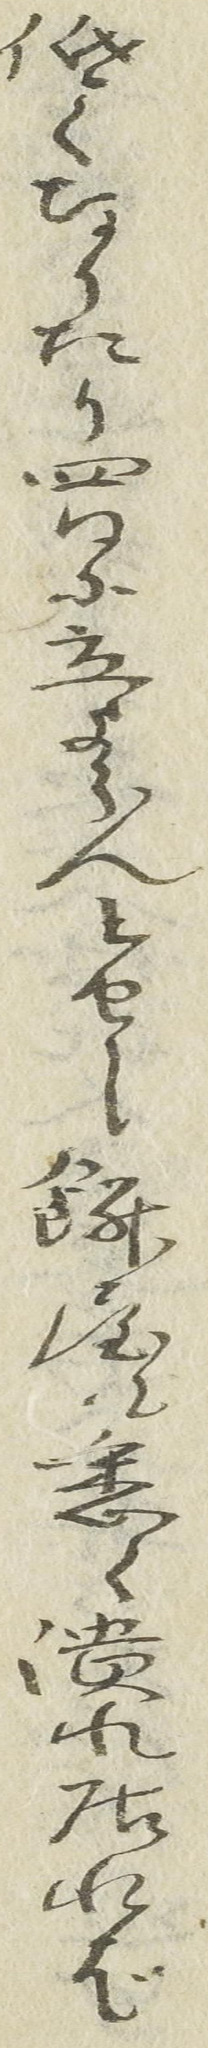低くなりたり四日に立よらんとせし餅屋も悉く潰れ居れば
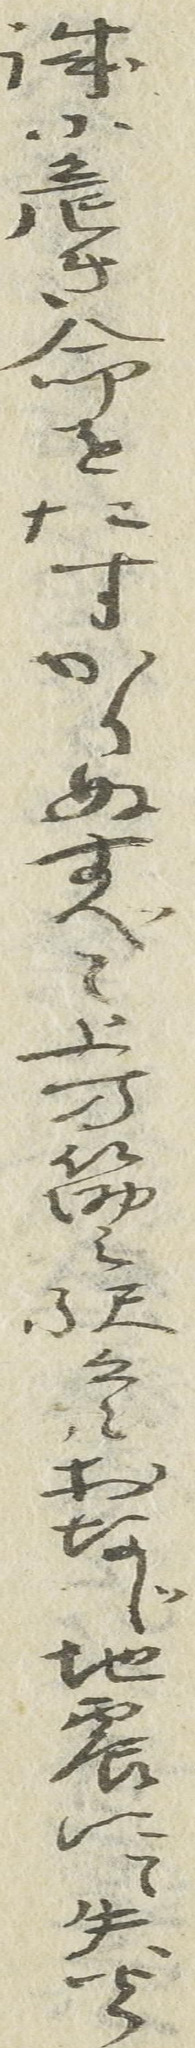誠に危き命をたすかりぬすべて上方筋之駅々もおなじ地震にて失火
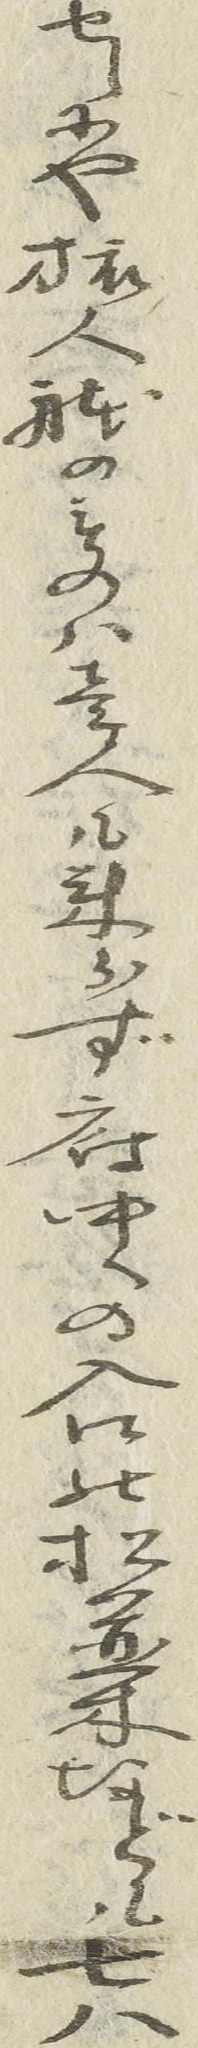せしにや旅人躰のものハ壱人も来らず府中への入口の松並木なども七八
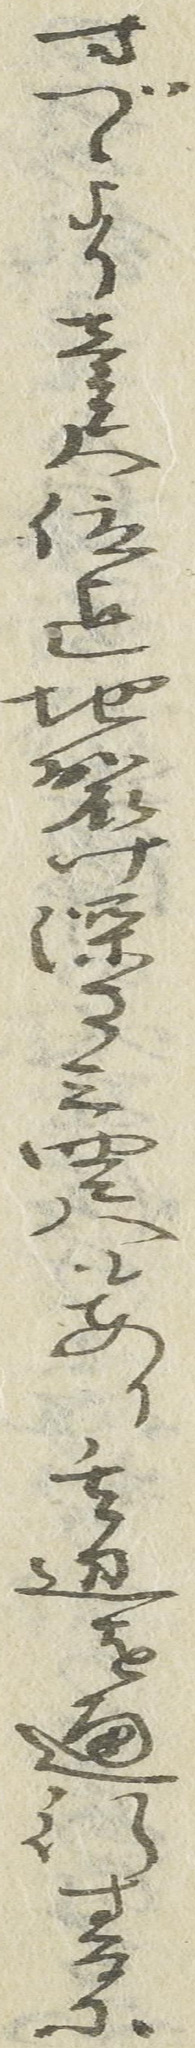寸づゝより壱尺位迄地裂け深さ三四尺もあり其辺を通行するに
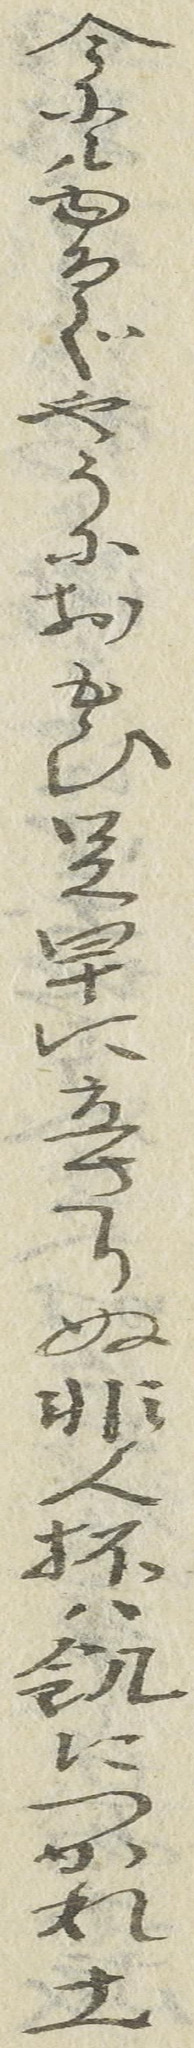今にもゆるぐやうにおもひ足早に立さりぬ非人抔ハ飢につかれ土
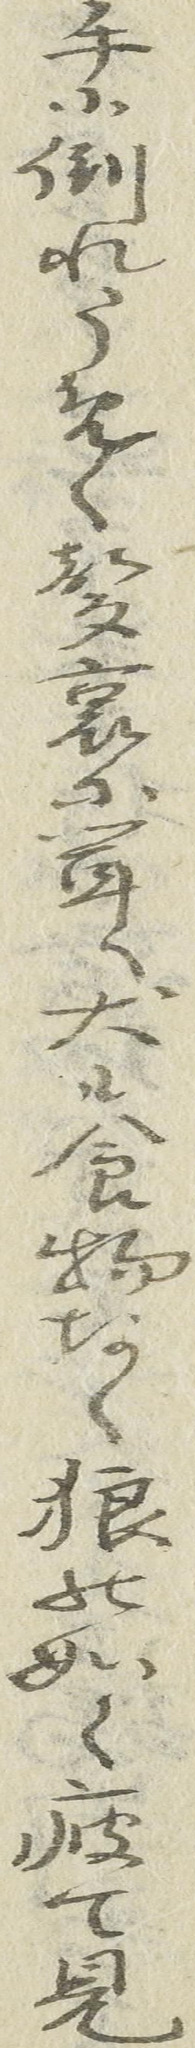手に倒れうめく聲哀に聞へ犬も食物なく狼の如く痩て見
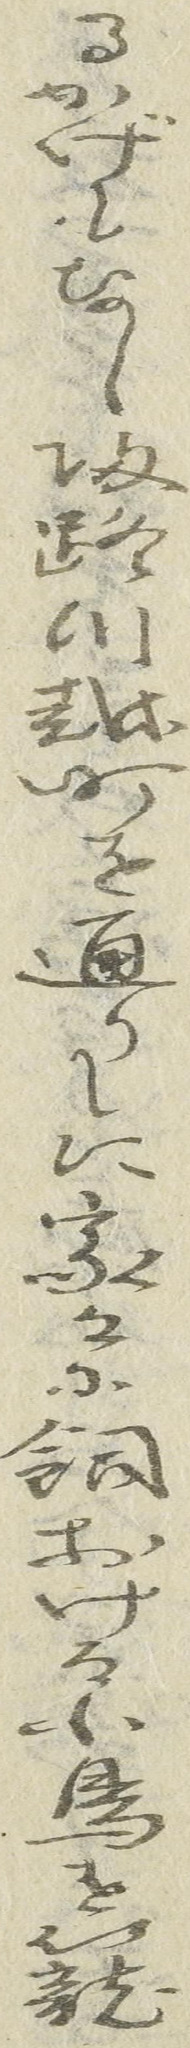るかげもなし帰路川越町を通りしに家々に飼おける小鳥を籠

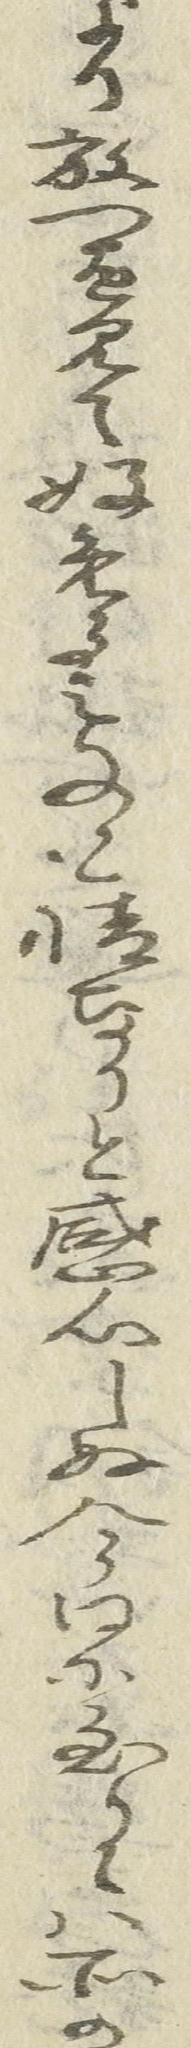より放つを見て好めるものも情なりと感心し給今日に至りては所の
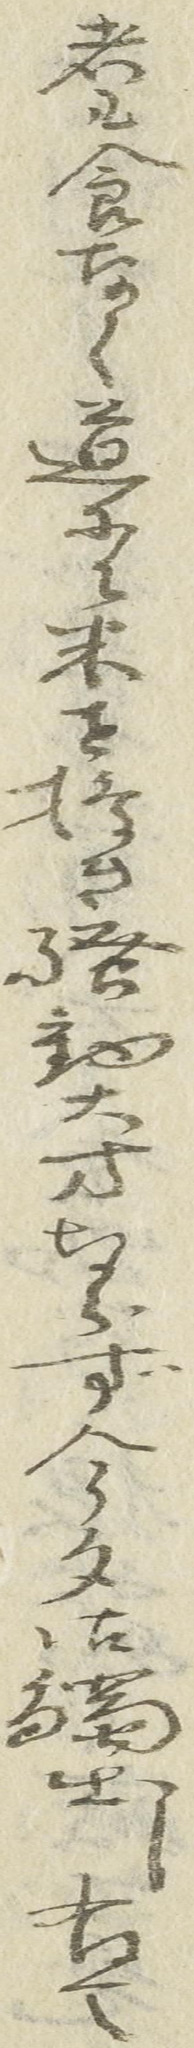者も食なく道にて米を搗き騒動大方ならず今夕御触出し有て
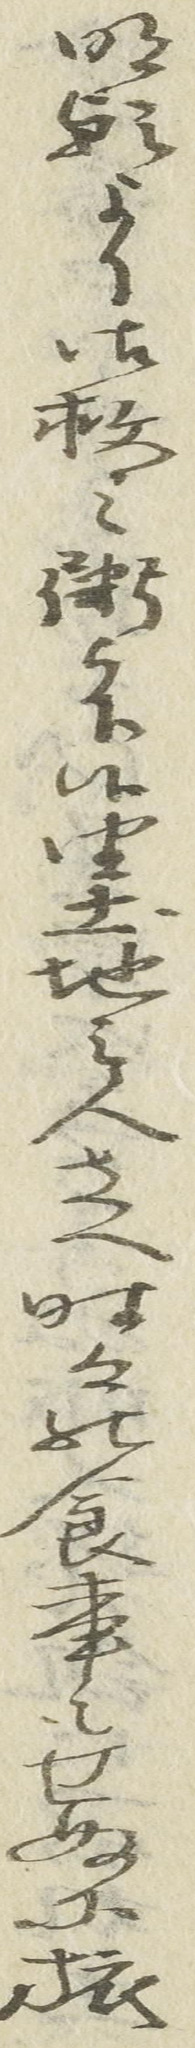明朝より御救之粥被下候由土地之人さへ時々の食事もせぬに旅
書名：地震前兆集　全
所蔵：東京大学地震研究所図書室 Earthquake Research Institute Library, The University of Tokyo, JAPAN
